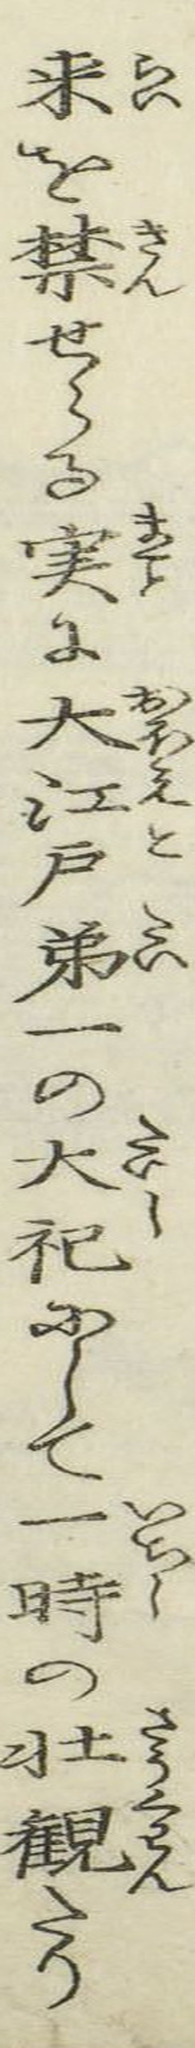来を禁せらる実に大江戸第一の大祀にして一時の壮観たり
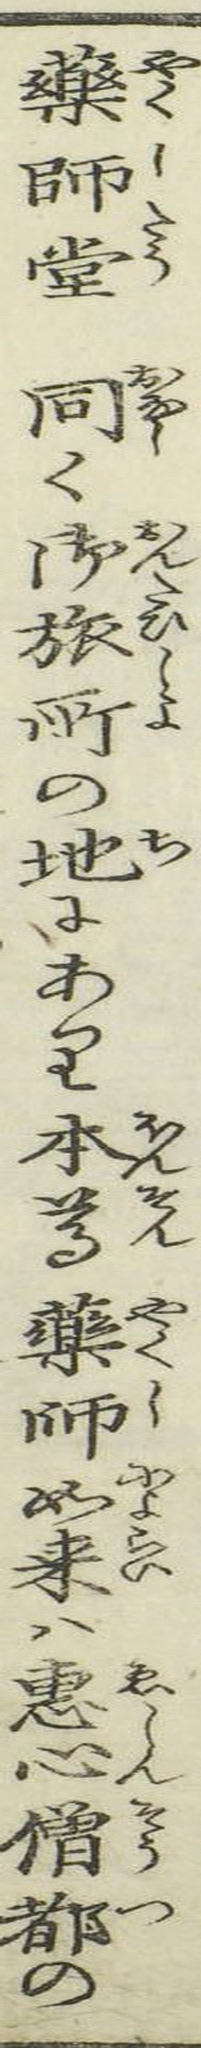薬師堂同く御旅所の地にあり本尊薬師如来は恵心僧都の
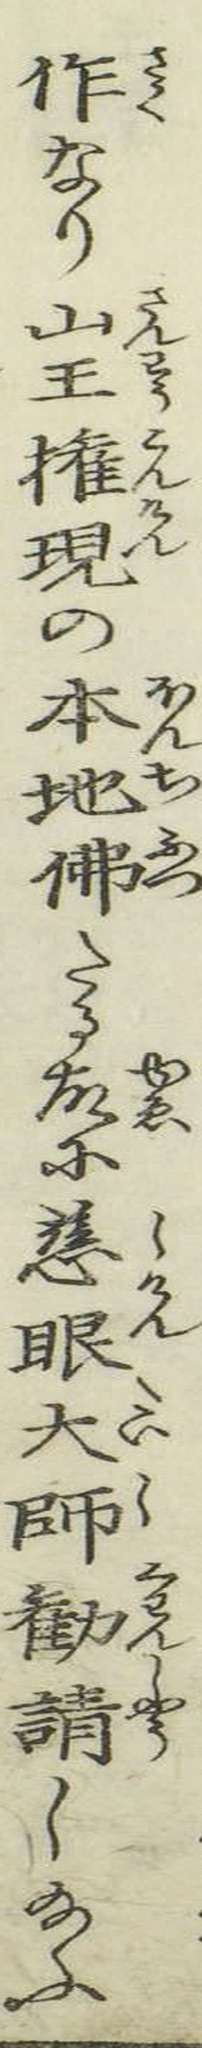作なり山王権現の本地佛たる故に慈眼大師勧請し給ふ

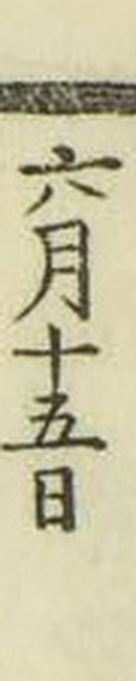六月十五日
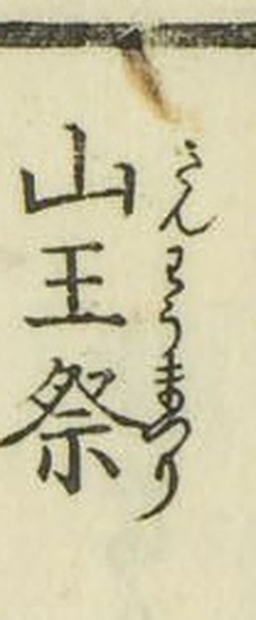山王祭
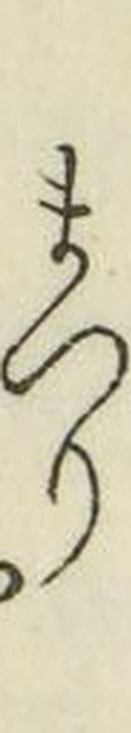まつり

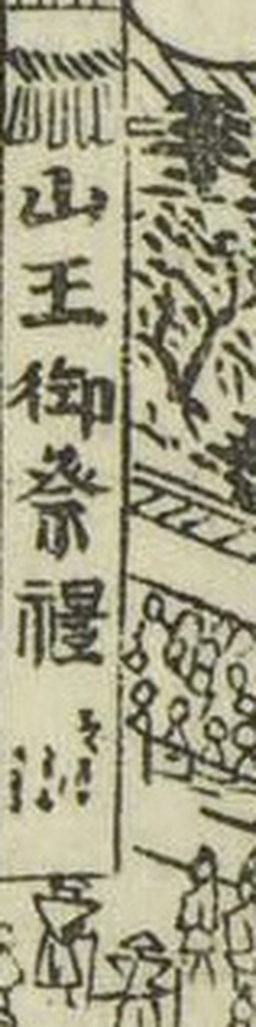山王御祭禮
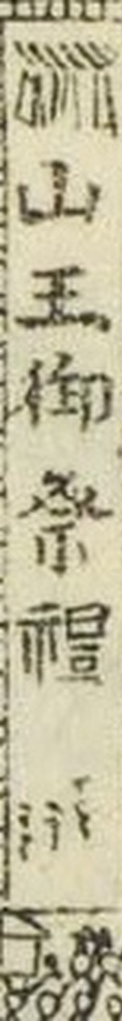山王御祭禮
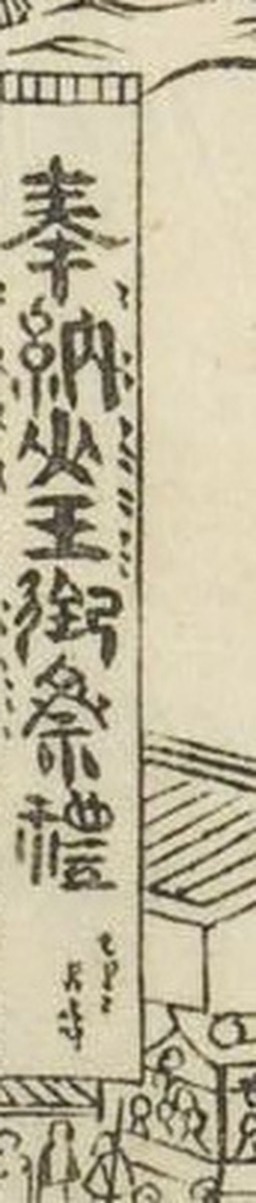奉納山王御祭禮
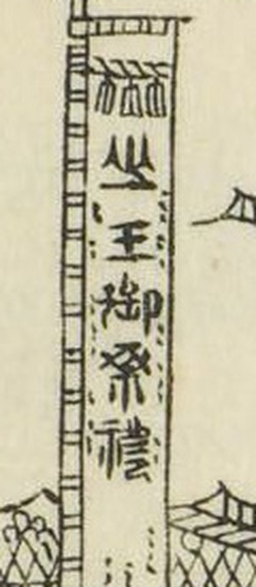山王御祭禮

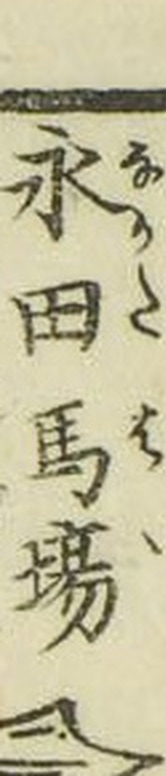永田馬場
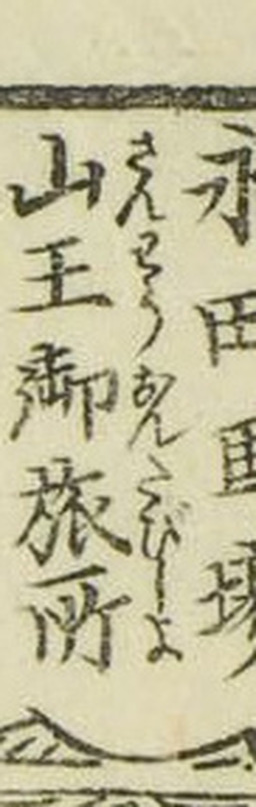山王御旅所
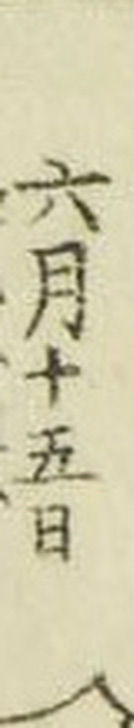六月十五日
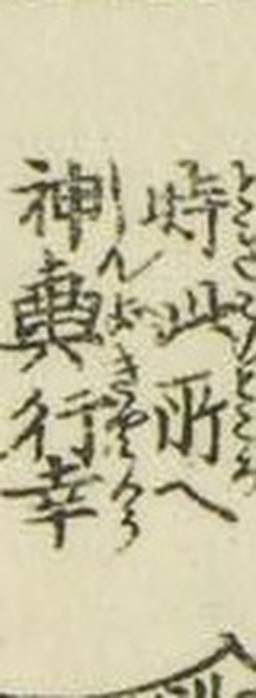神輿行幸
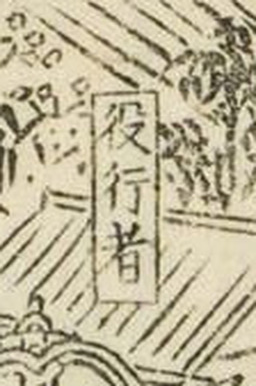役行者
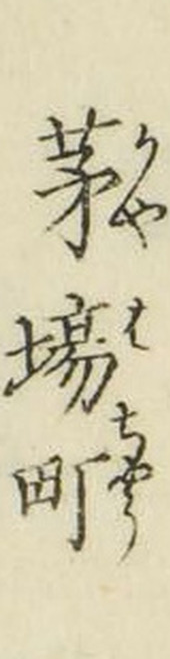茅場町
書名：江戸名所図会 20巻 巻之2
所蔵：東京学芸大学教育コンテンツアーカイブ
